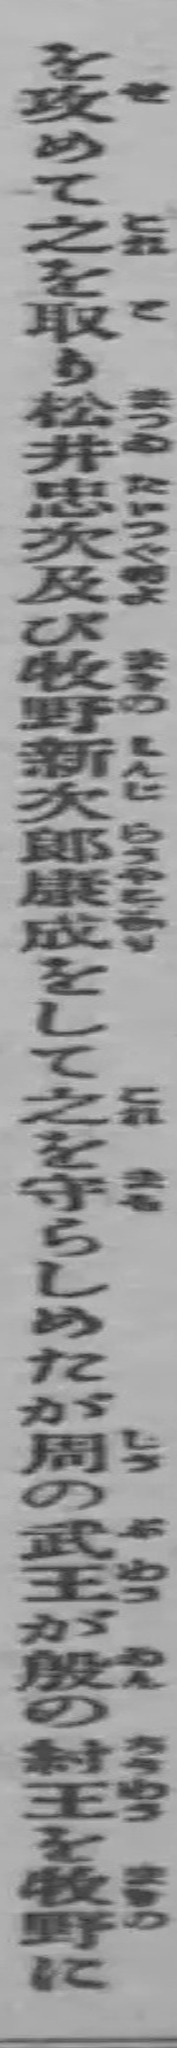を攻めて之を取り松井忠次及び牧野新次郎康成をして之を守らしめたが周の武王が殷の紂王を牧野に
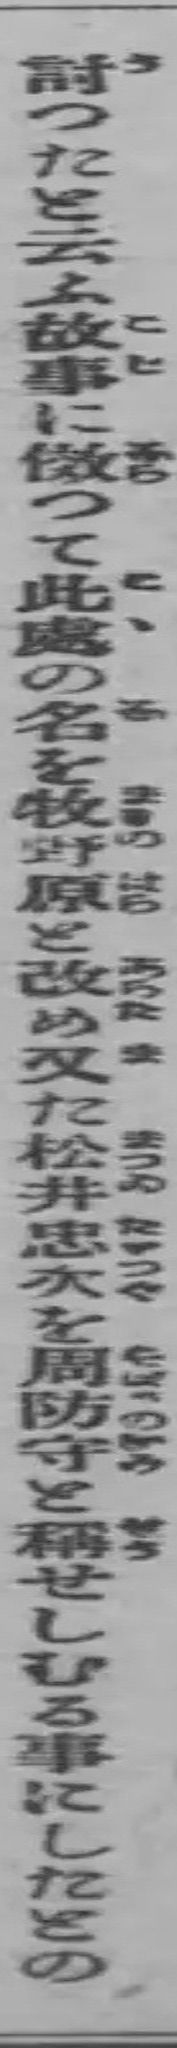討つたと云ふ故事に倣つて此処の名を牧野原と改め又た松井忠次を周防守と称せしむる事にしたとの
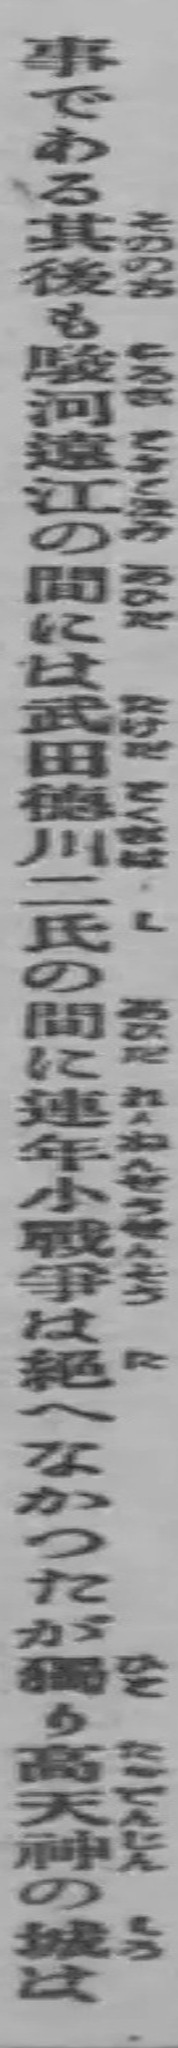事である其後も駿河遠江の間には武田徳川二氏の間に連年小戦争は絶へなかつたが独り高天神の城は
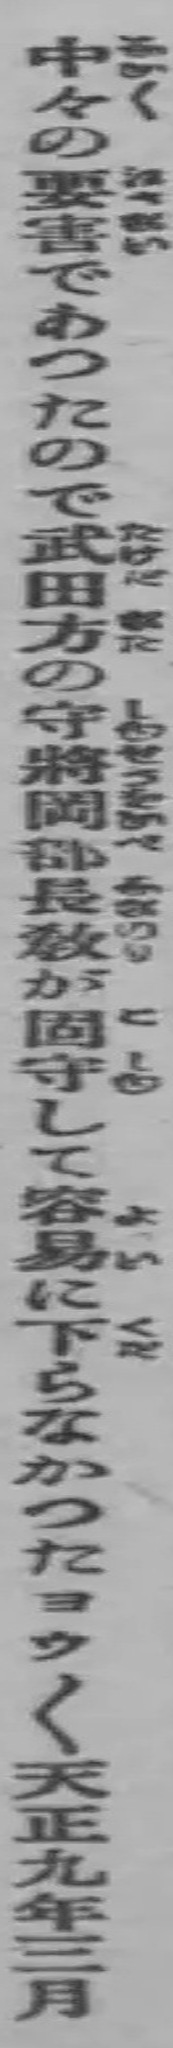中々の要害であつたので武田方の守将岡部長教が固守して容易に下らなかつたヨウ〳〵天正九年三月
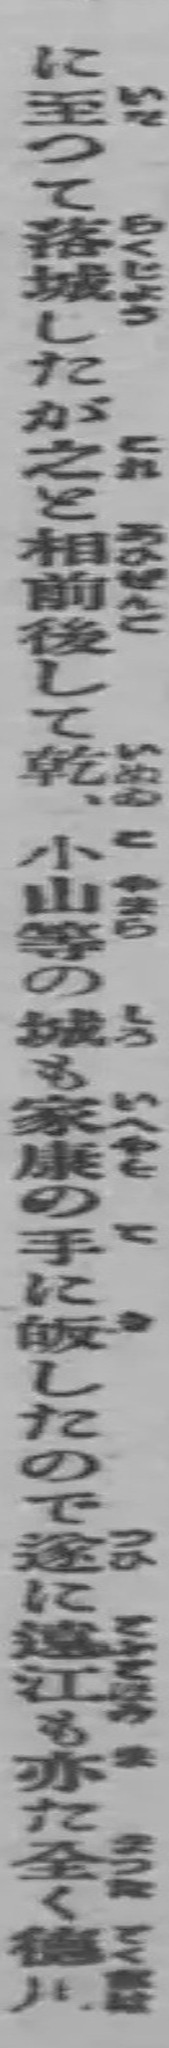に至つて落城したが之と相前後して乾、小山等の城も家康の手に皈したので遂に遠江も亦た全く徳川
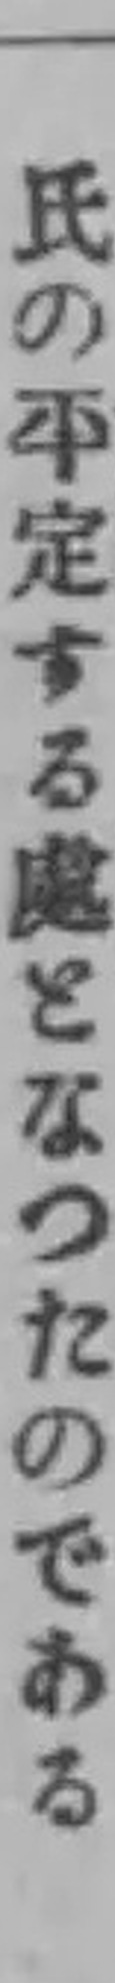氏の平定する処となつたのである
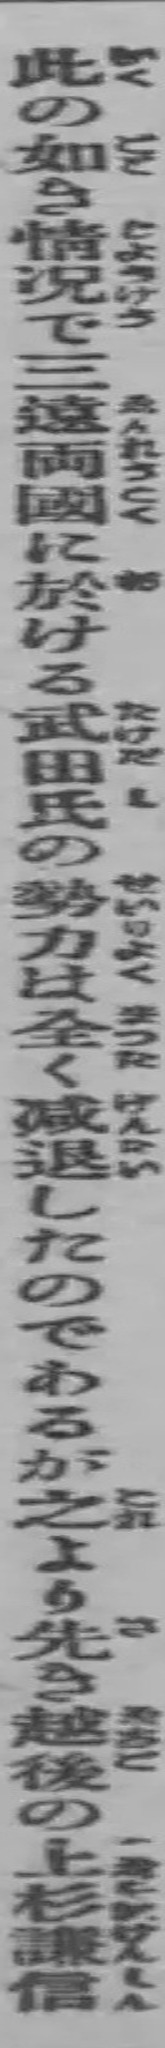此の如き情況で三遠両国に於ける武田氏の勢力は全く減退したのであるが之より先き越後の上杉謙信
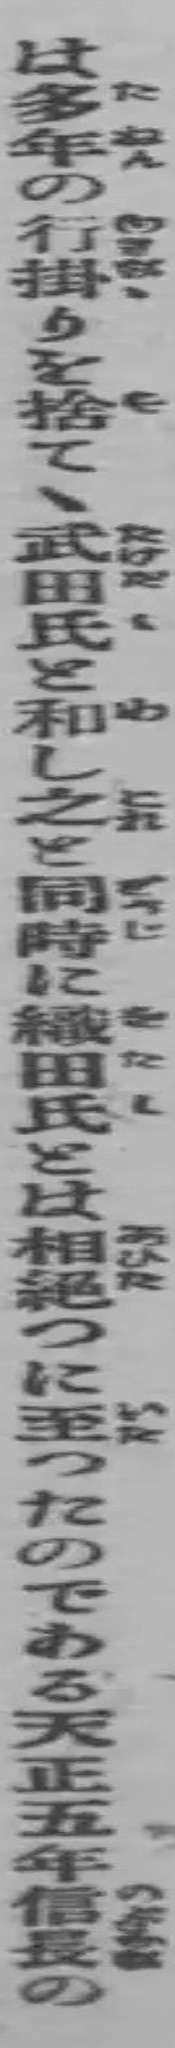は多年の行掛りを捨てゝ武田氏と和し之と同時に織田氏とは相絶つに至つたのである天正五年信長の
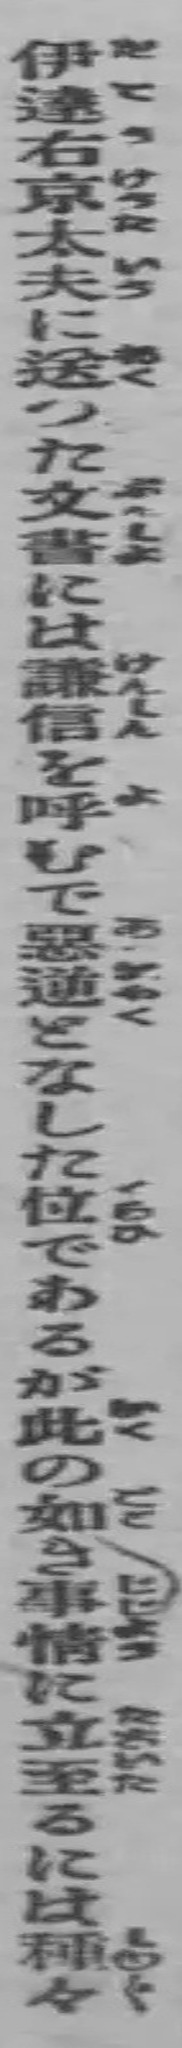伊達右京太夫に送つた文書には謙信を呼むで悪逆となした位であるが此の如き事情に立至るには種々
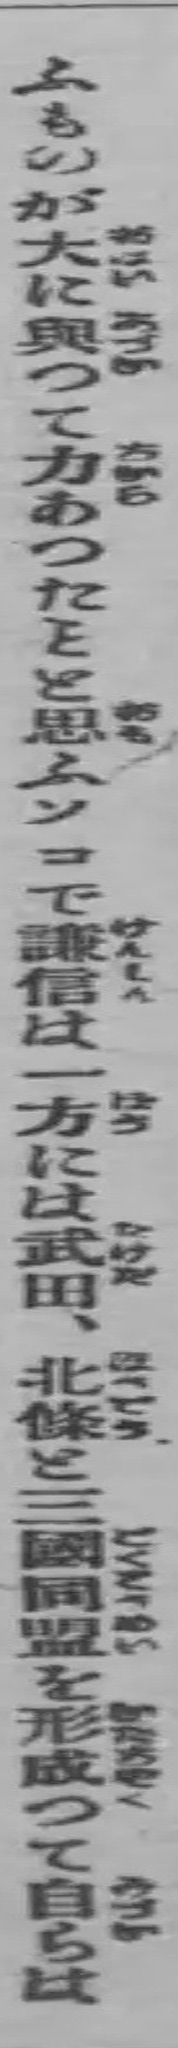盟ふものが大に與つて力あつたことと思ふソコで謙信は一方には武田、北條と三国同盟を形成つて自らは
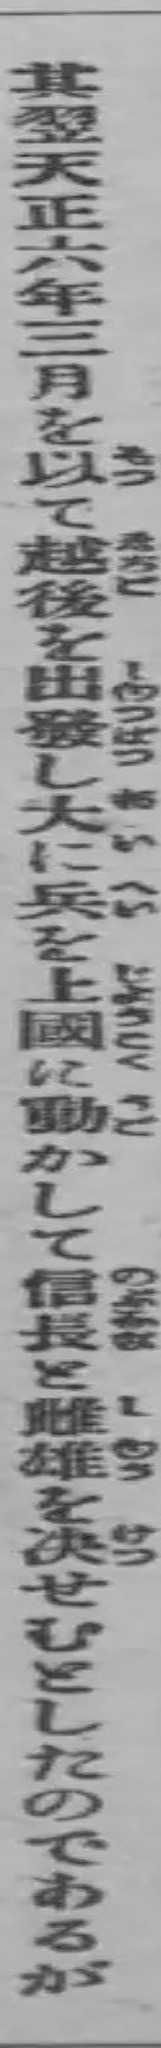其翌天正六年三月を以て越後を出発し大に兵を上国に動かして信長と雌雄を決せむとしたのであるが
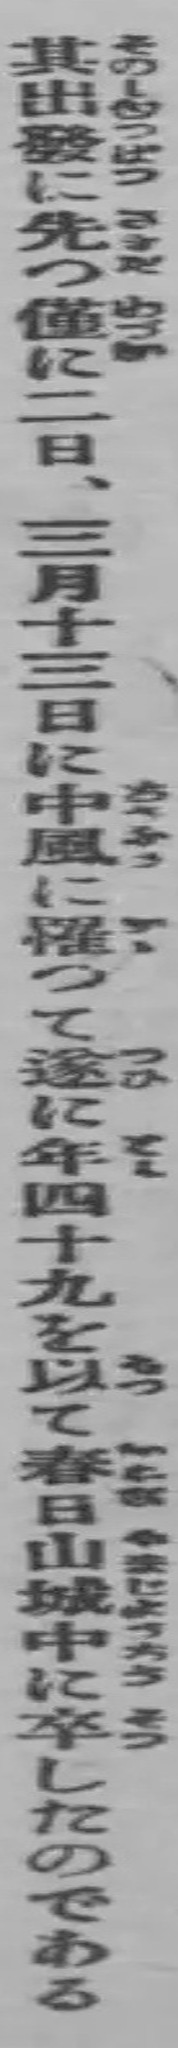其出発に先つ僅に二日、三月十三日に中風に罹つて遂に年四十九を以て春日山城中に卒したのである
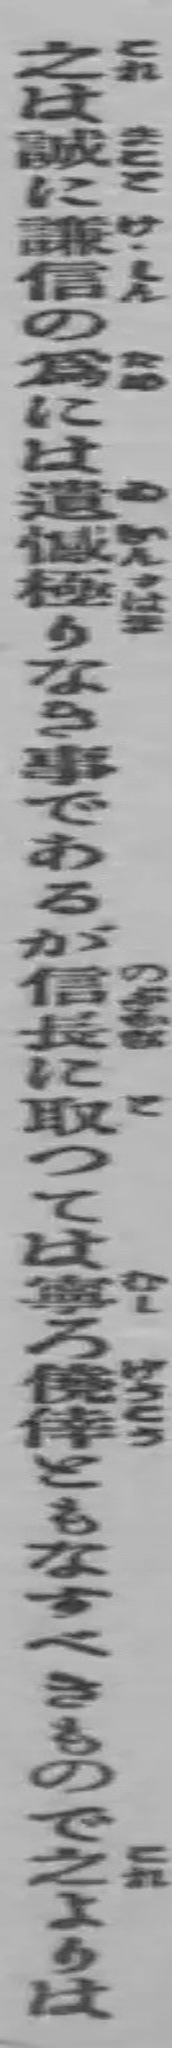之は誠に謙信の為には遺憾極りなき事であるが信長に取つては寧ろ僥倖ともなすべきもので之よりは
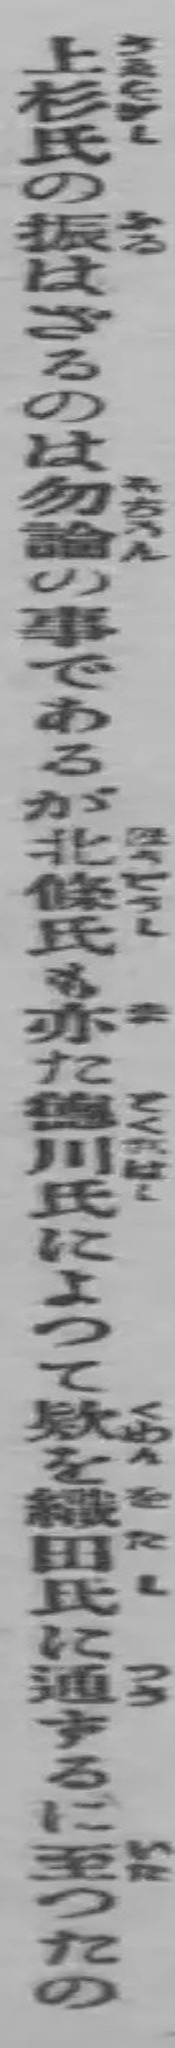上杉氏の振はざるのは勿論の事であるが北條氏も亦た徳川氏によつて欵を織田氏に通ずるに至つたの
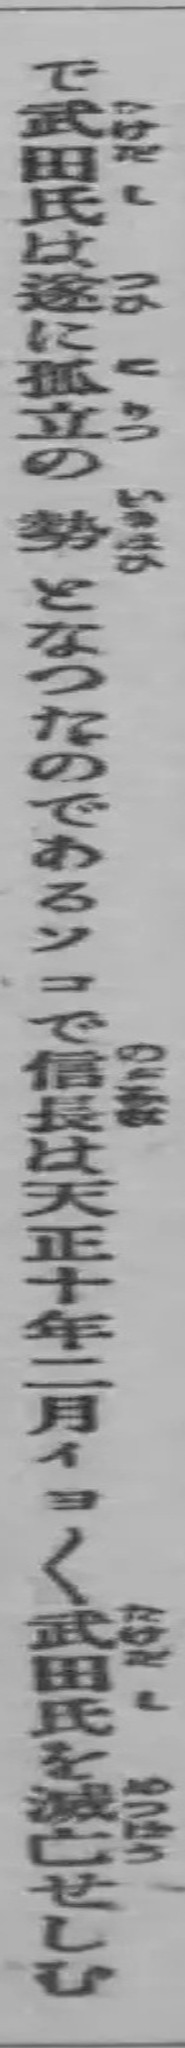で武田氏は遂に孤立の勢となつたのであるソコで信長は天正十年二月イヨ〳〵武田氏を滅亡せしむ
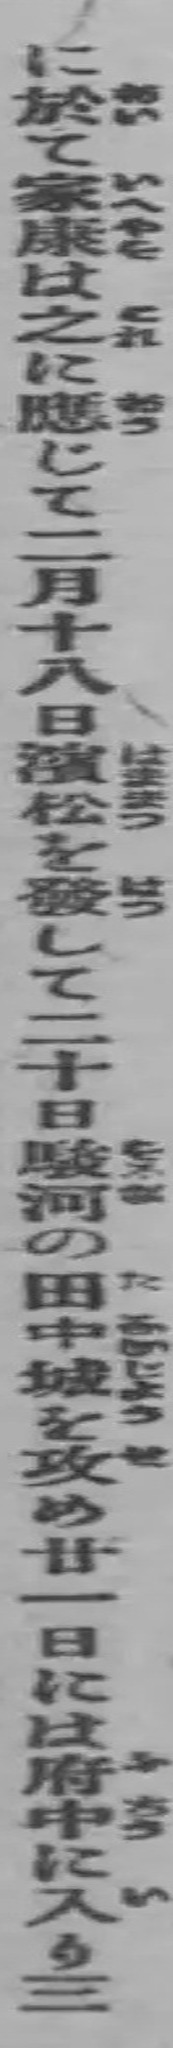に於て家康は之に応じて二月十八日浜松を発して二十日駿河の田中城を攻め廿一日には府中に入り三
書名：豊橋市史談
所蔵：国立国会図書館 National Diet Library, JAPAN
